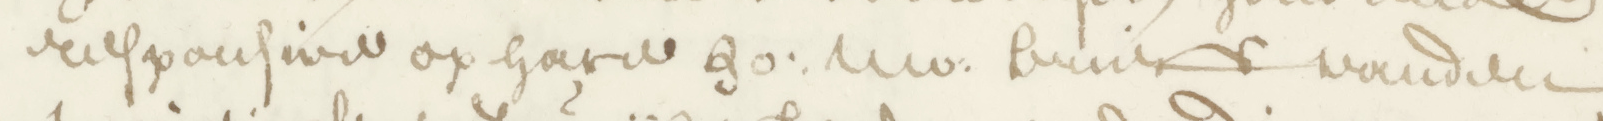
responsive op hare ho:Mo: brieff vanden
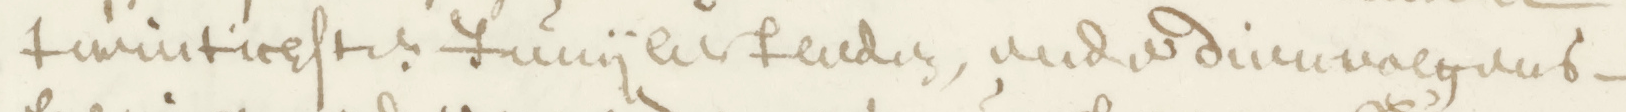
twintichsten Junij lestleden, ende dienvolgens —
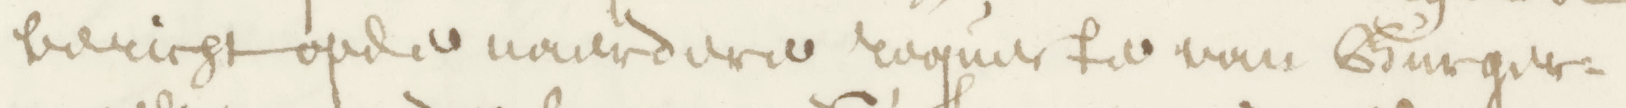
bericht opde naerdere requeste van Burger„
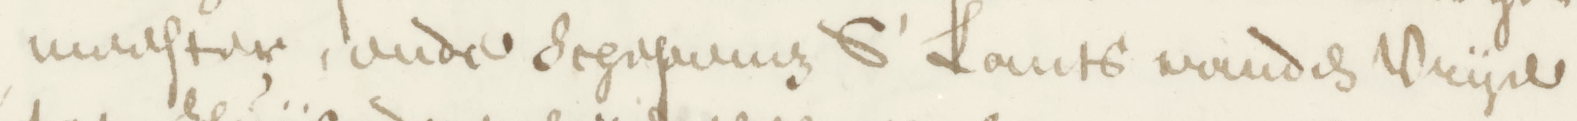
„meester, ende Schepenen S‛Lants vanden Vrije
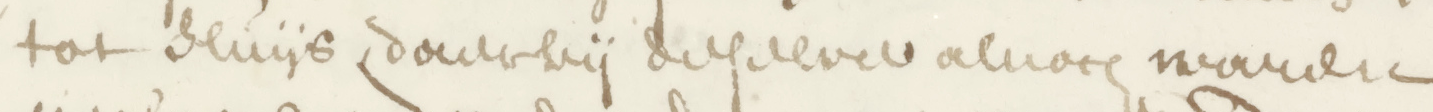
tot Sluijs, daerbij deselve alnoch waren
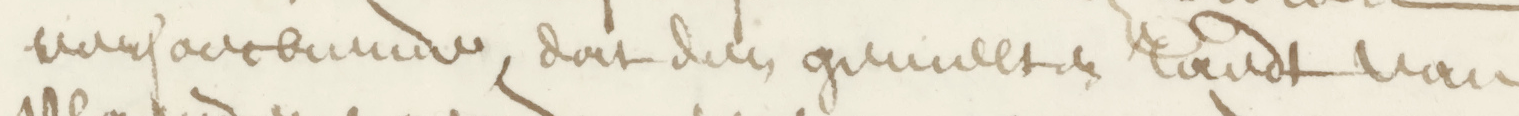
versoeckende, dat den gemelten Raedt van
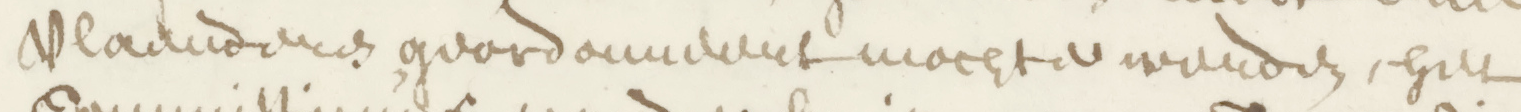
Vlaenderen geordonneert mochte werden, het
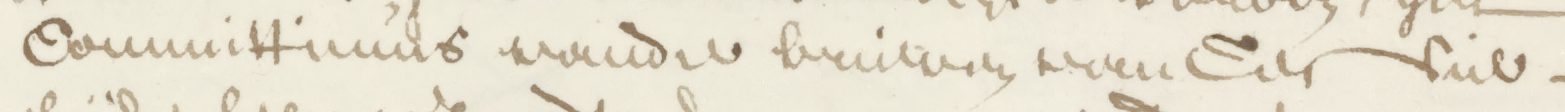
Committimus vande brieven van Cessie
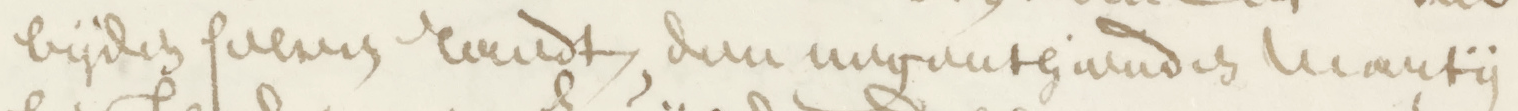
bijden selven Raedt, den negenthienden Martij
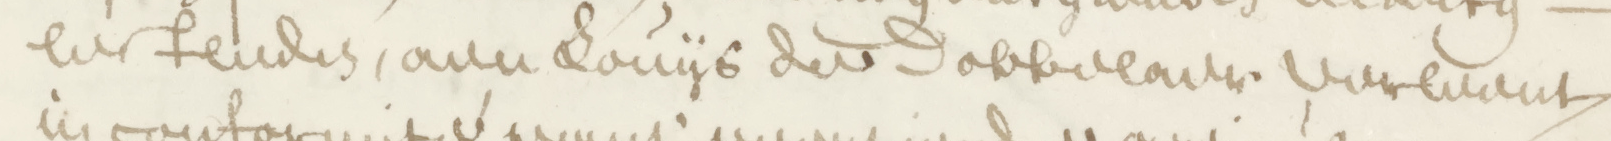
lestleden, aen Louijs de Dobbelaer verleent,
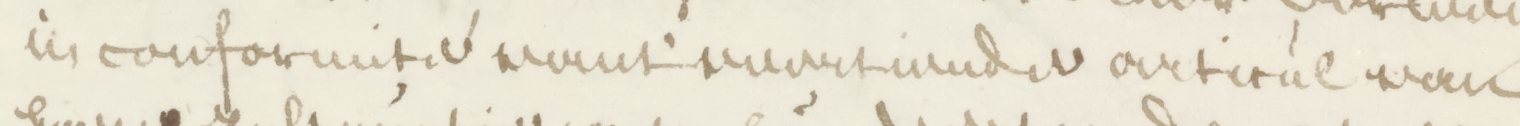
in conformité vant' veertiende articul van
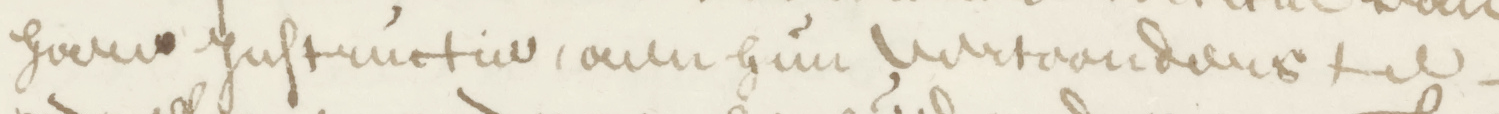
hare Instructie, aen hun vertoonders te
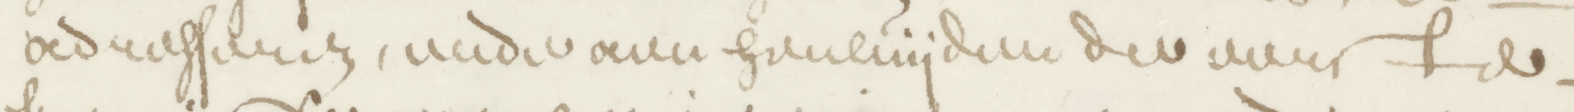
adresseren, ende aen henluijden die eerste
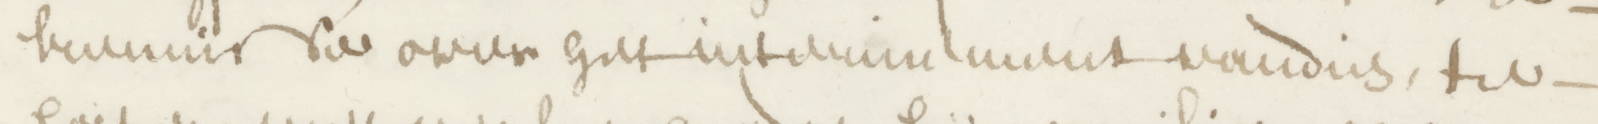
kennisse over het interinement vandien, te
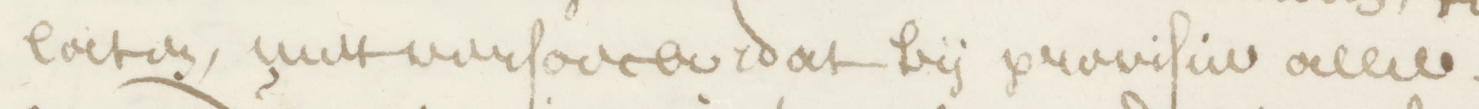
laten, met versoeck, dat bij provisie alle
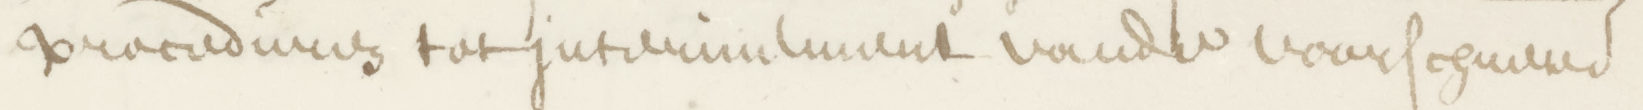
proceduren tot interinement vande voorschreve
